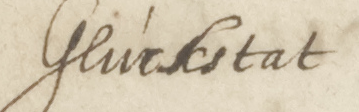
Gluckstat
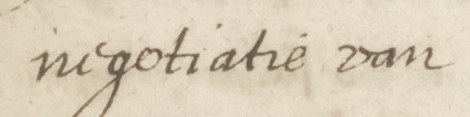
negotiatie van
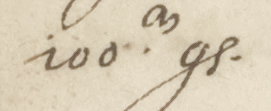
100m gs
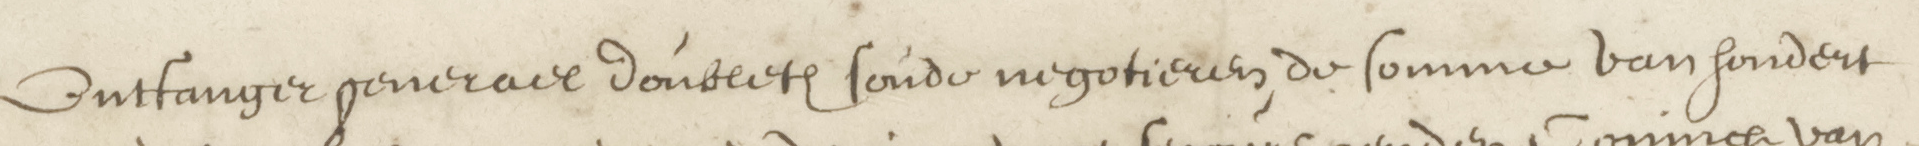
Ontfanger generael doubleth soude negotieren de somme van hondert
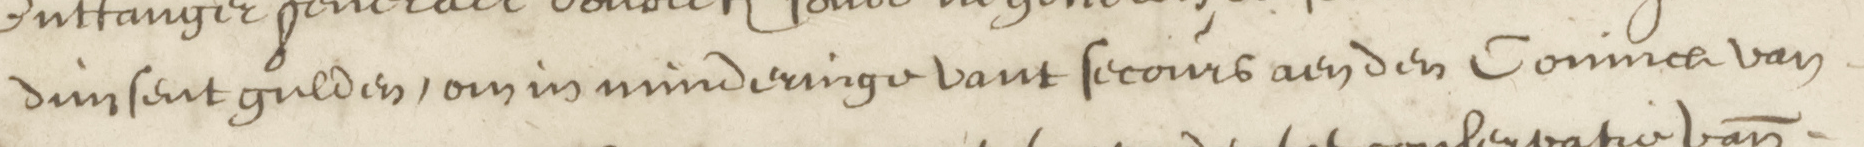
duysent gulden, om in minderinge vant secours aen den Conick van
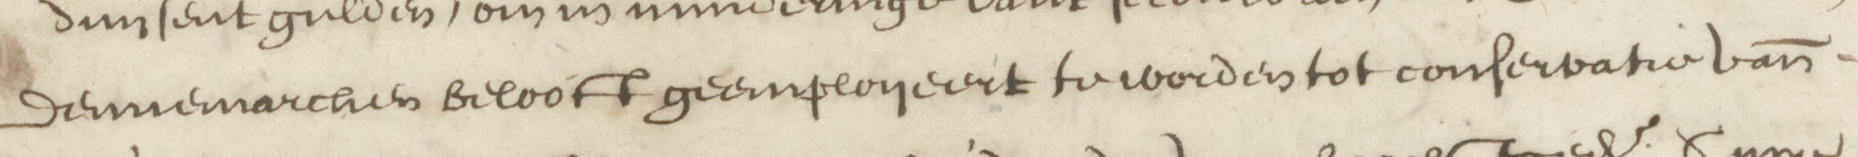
Dennemarcken belooft geemployeert te worden tot conservatie van
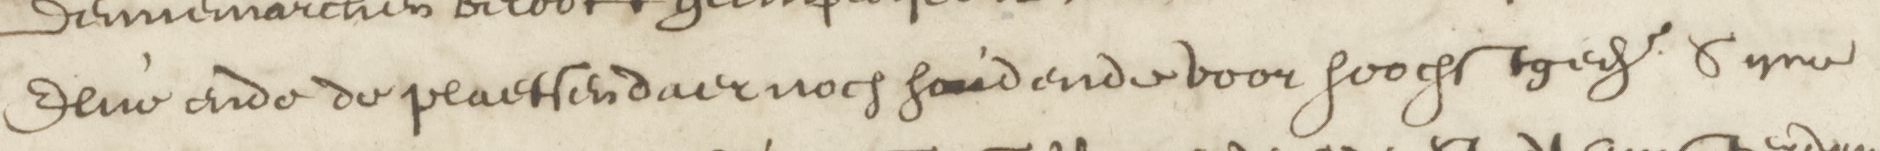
Elue ende de plaetsen daer noch houdende voor hoochstgede Syne
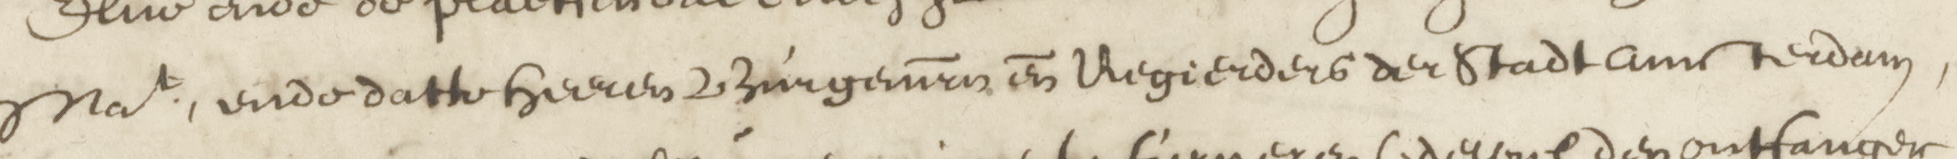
Mat. , ende datte heeren Burgemrn en Regierders der Stadt Amsterdam,
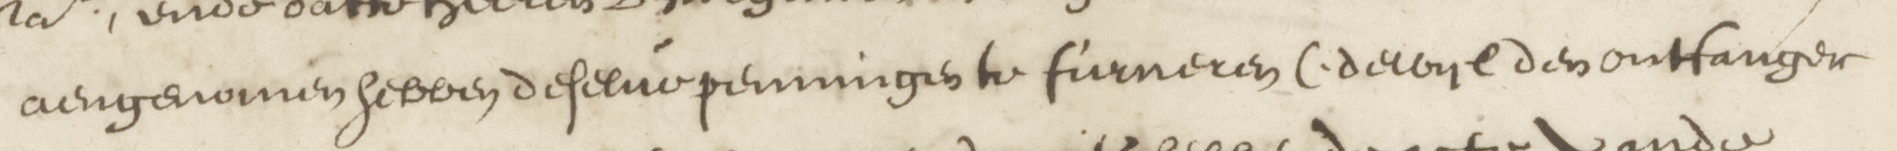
aengenomen hebben deselue penningen te furneren (.dewyl den ontfanger
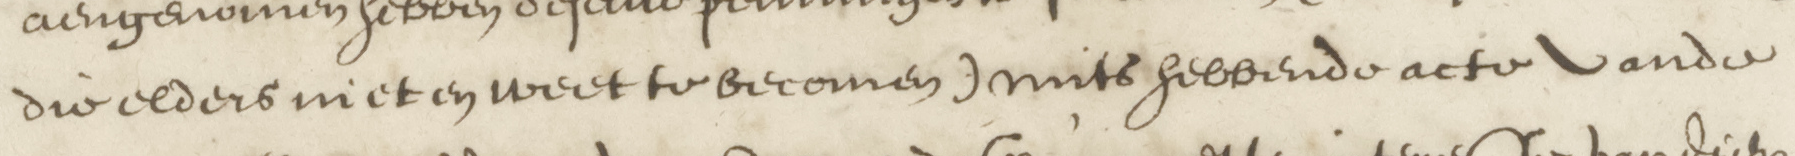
die elders niet en weet te becomen.) mits hebbende acte vande
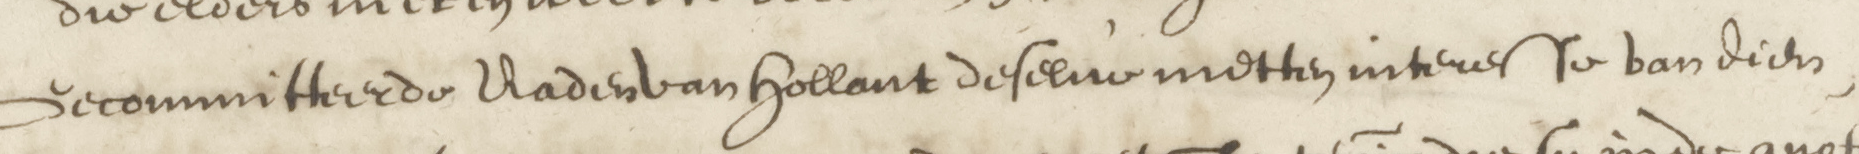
Gecommitteerde Raden van Hollant deselue metten interesse van dien
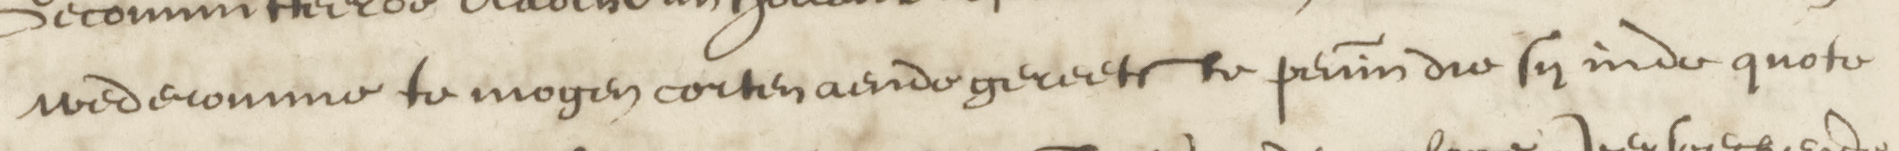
wederomme te mogen corten aende gereetste penin die sy inde quote
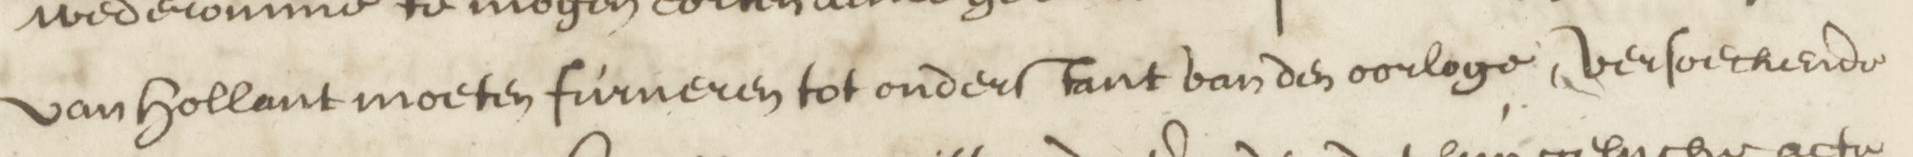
van Hollant moeten furneren tot onderstant van den oorloge, versoeckende
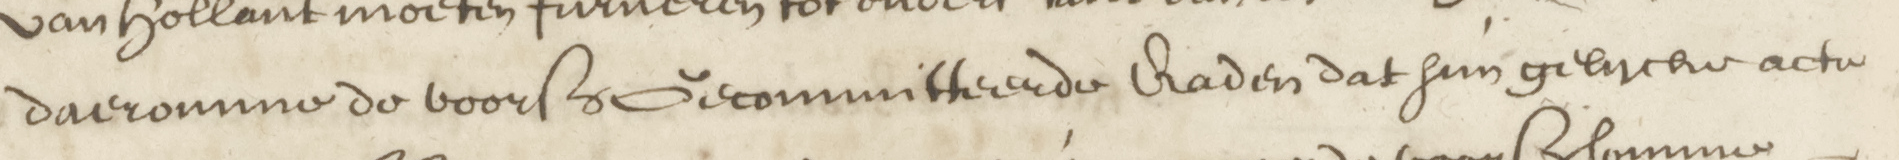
daeromme de voors Gecommitteerde Raden dat hun gelycke acte
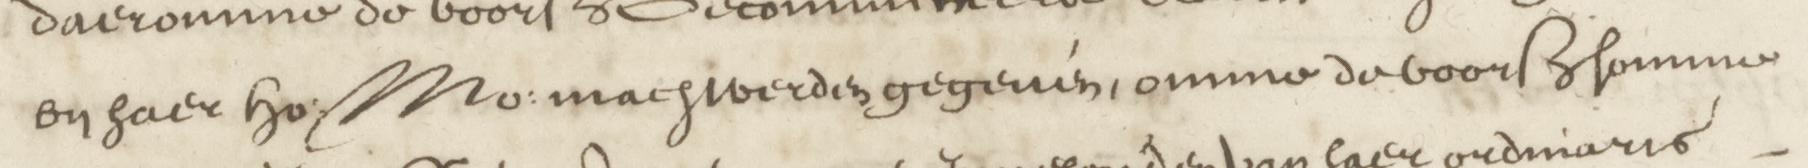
by haer ho:Mo: mach werden gegeuen, omme de voors somme
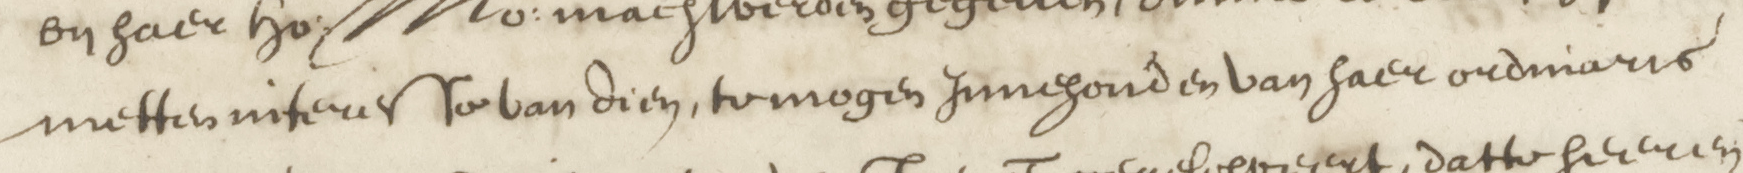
metten interesse van dien, te mogen Innehouden van haer ordinaris
